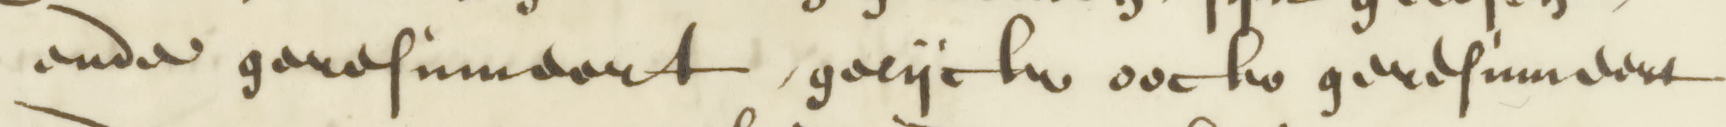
ende geresumeert, gelijck oock geresumeert
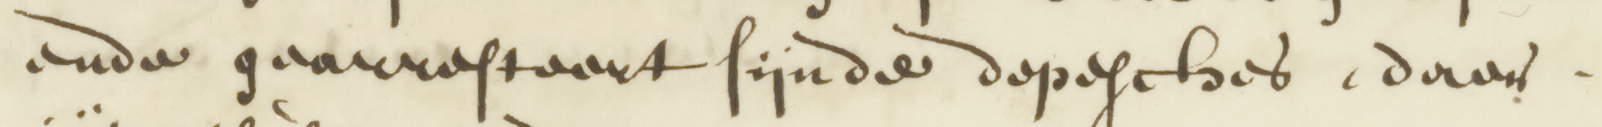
ende gearresteert sijn de depesches, daer
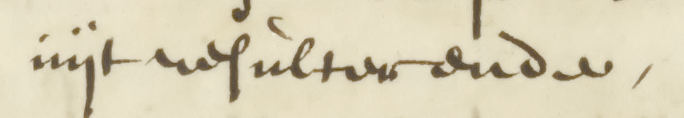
uijt resulterende.
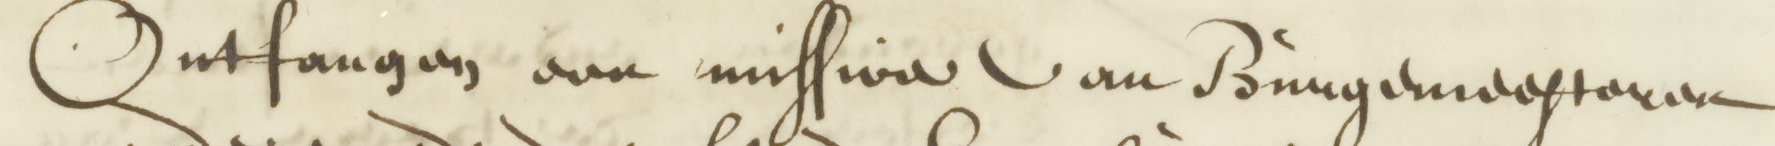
Ontfangen een missive van Burgemeesteren
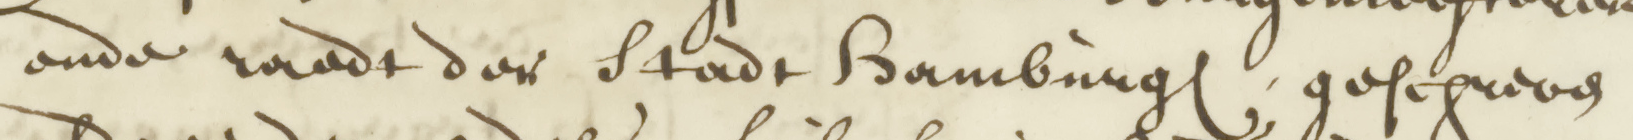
ende raedt der Stadt Hamburgh, geschreven
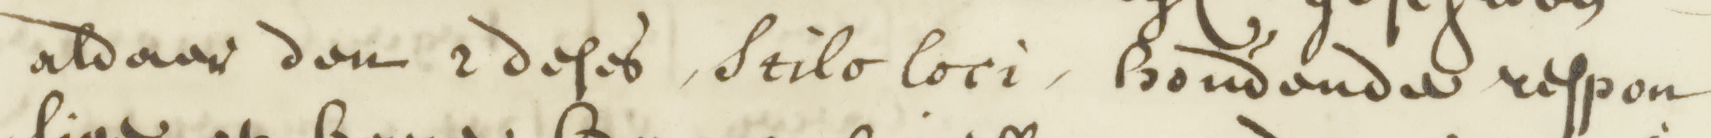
aldaer den 2 deses, stilo loci, houdende respon„
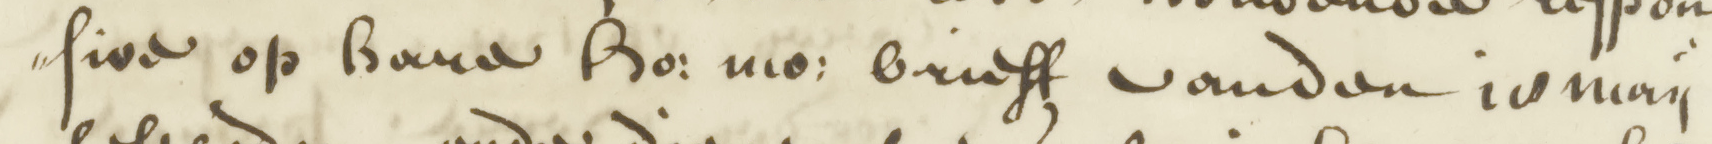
,,sive op hare Ho: Mo: brieff vanden 18 maij
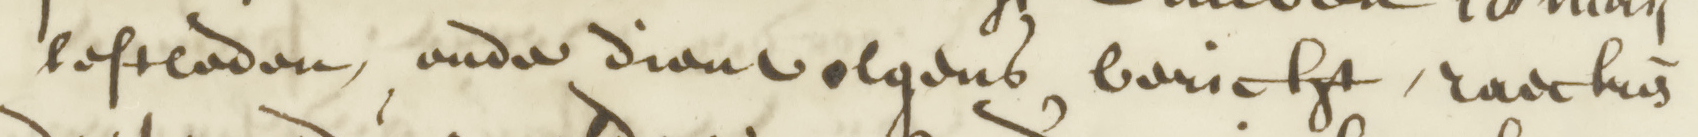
lestleden, ende dienvolgens bericht, raecken
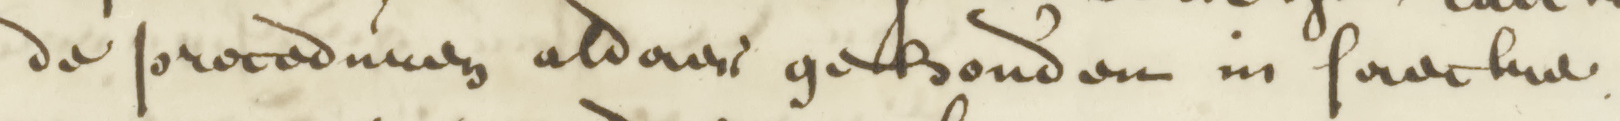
de proceduren aldaer gehouden in saecke
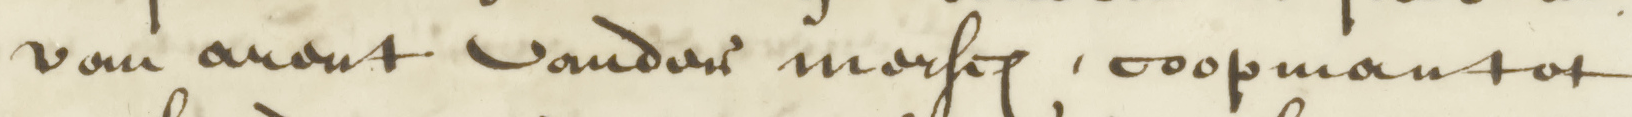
van Arent vander Morsch, coopman tot
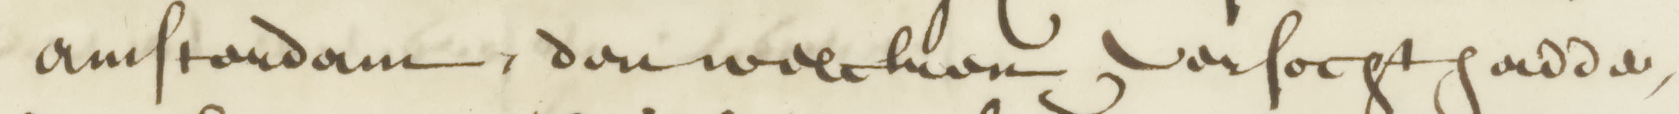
Amsterdam, den welcken versocht hadde
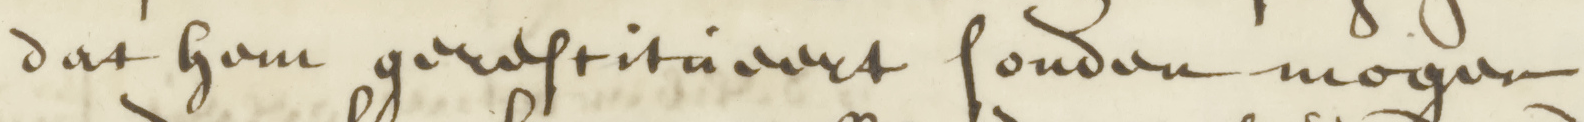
dat hem gerestitueert souden mogen
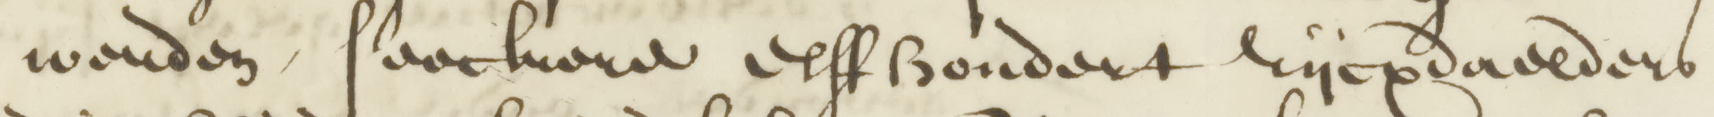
worden, seeckere elffhondert rijcxdaelders
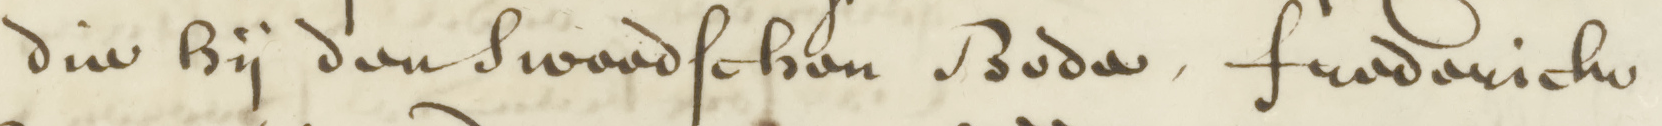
die hij den Sweedschen Bode, Frederick
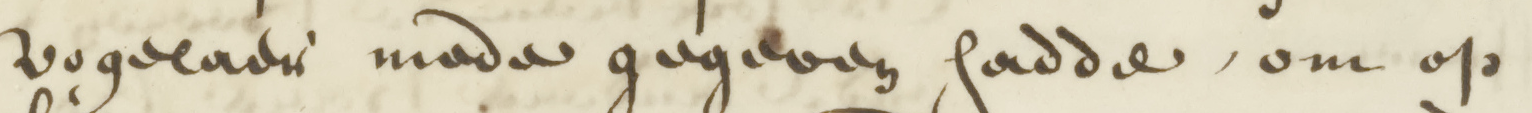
Vogelaer mede gegeven hadde, om op
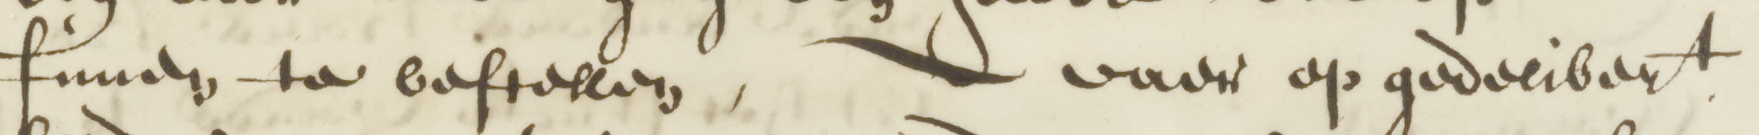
sunen te bestellen. Waer op gedelibereert
